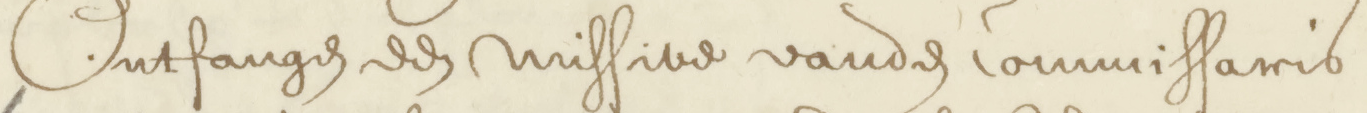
Ontfangen een missive vanden Commissaris
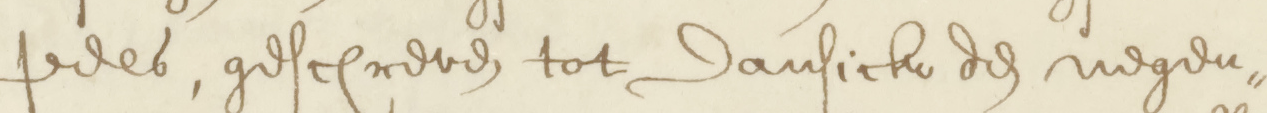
Pels, geschreven tot Dansick den negen„
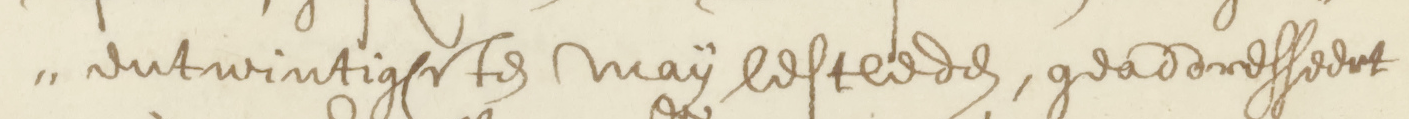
„entwintighsten maij lestleden, geaddresseert
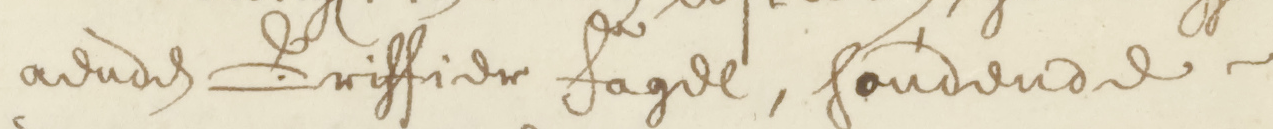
aenden Griffier Fagel, houdende
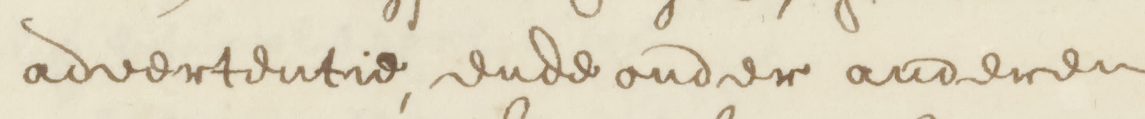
advertentie, ende onder anderen
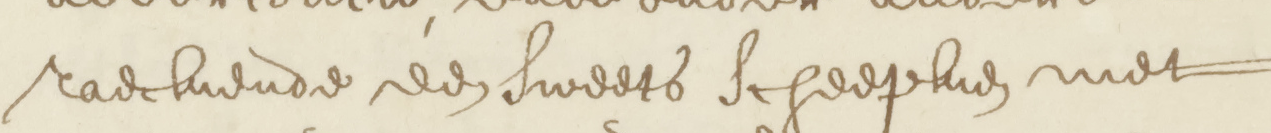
raeckende een Sweets Scheepken met
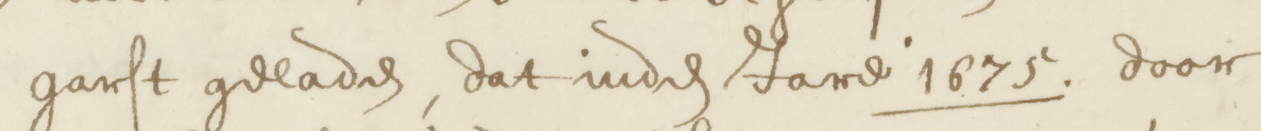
garst geladen, dat inden Jare 1675. door
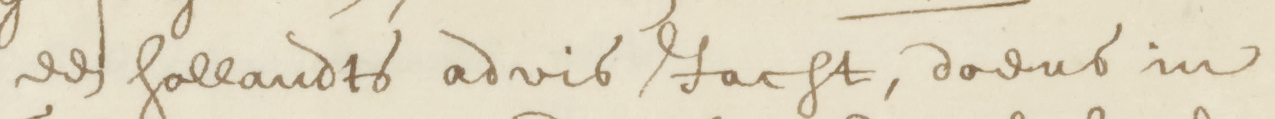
een Hollandts advis Jacht, doens in
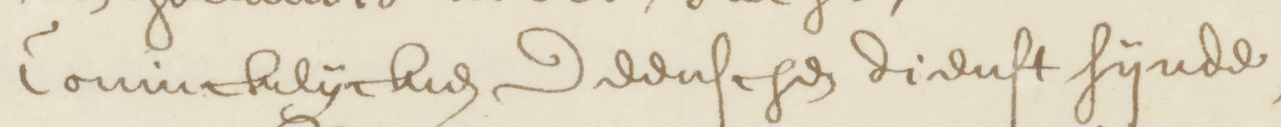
Conincklijcken Deenschen dienst sijnde,
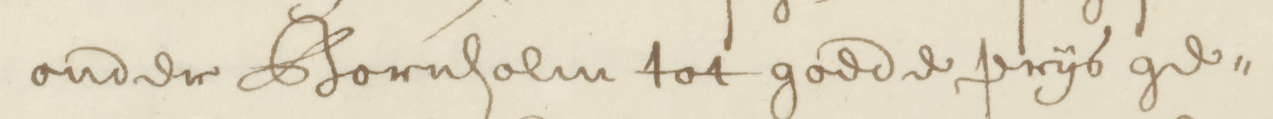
onder Bornholm tot goede prijs ge„
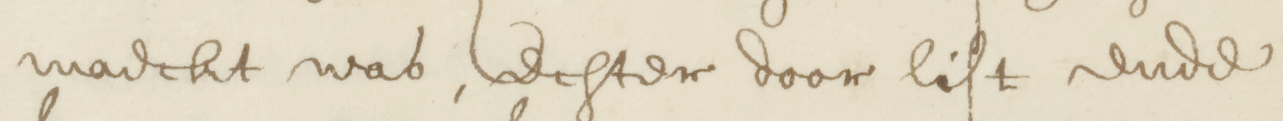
maeckt was, echter door list ende
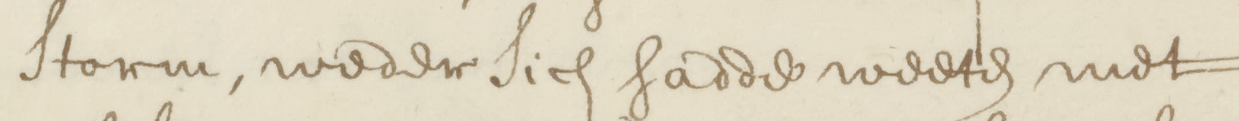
Storm, weder Sich hadde weeten met
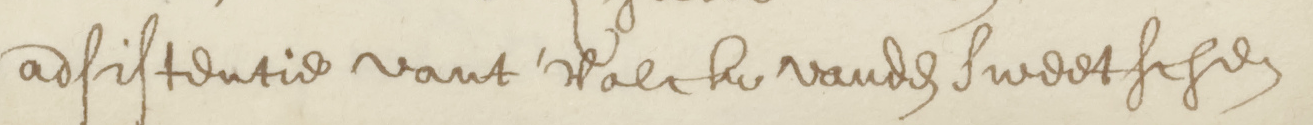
adsistentie vant‛ Volck vanden Sweetschen
